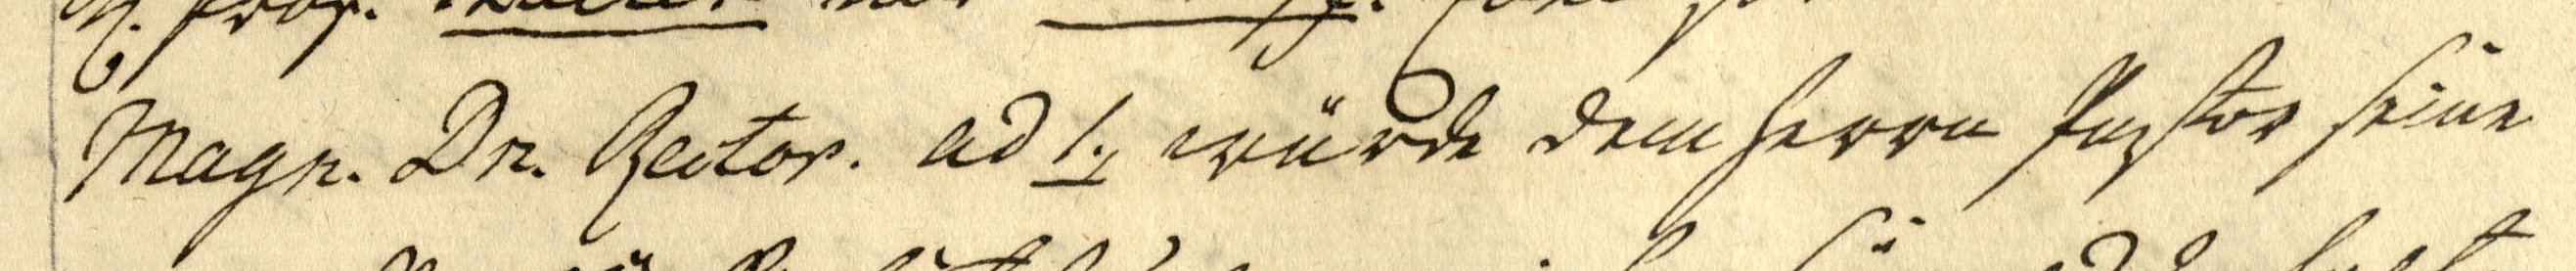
Magn. Dn. Rector. Ad 1., würde dem herrn Pastor seine
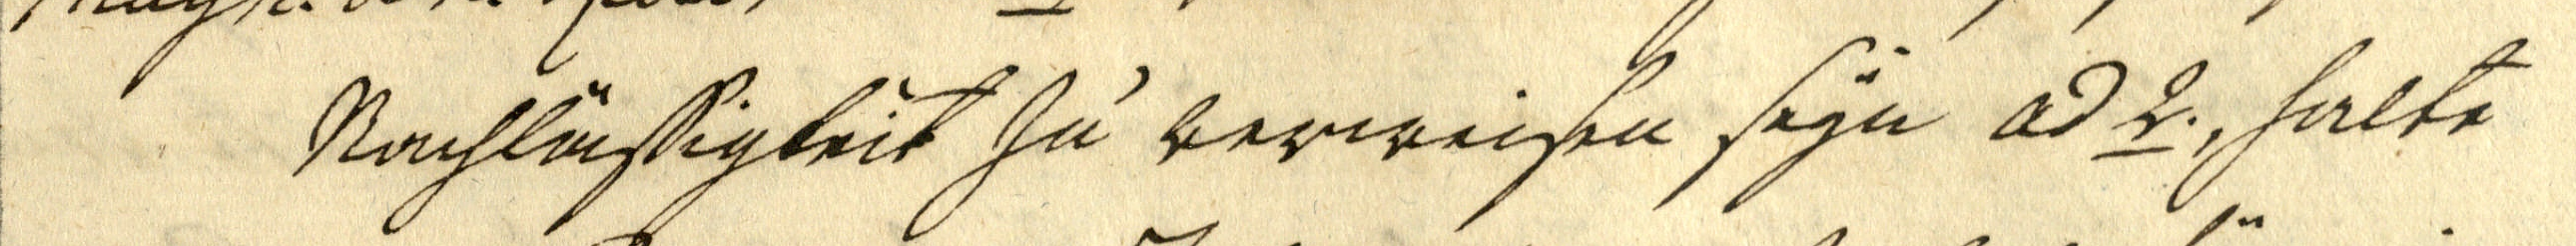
Nachlässigkeit zu verweisen seyn ad 2., halte
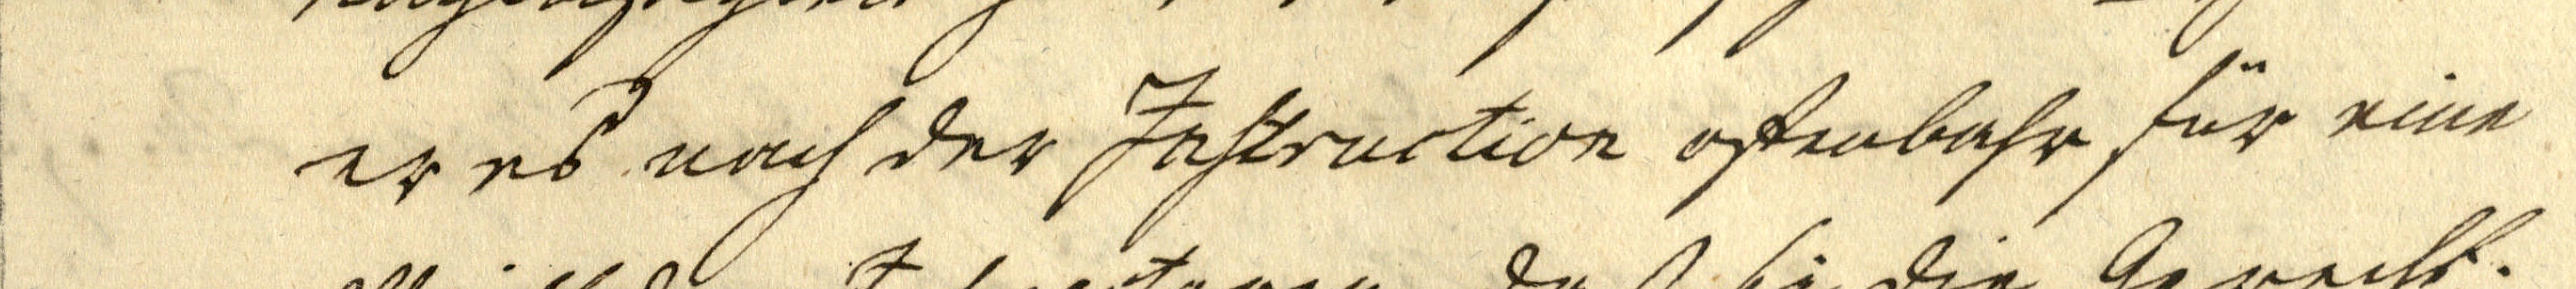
er es nach der Instruction offenbahr für eine
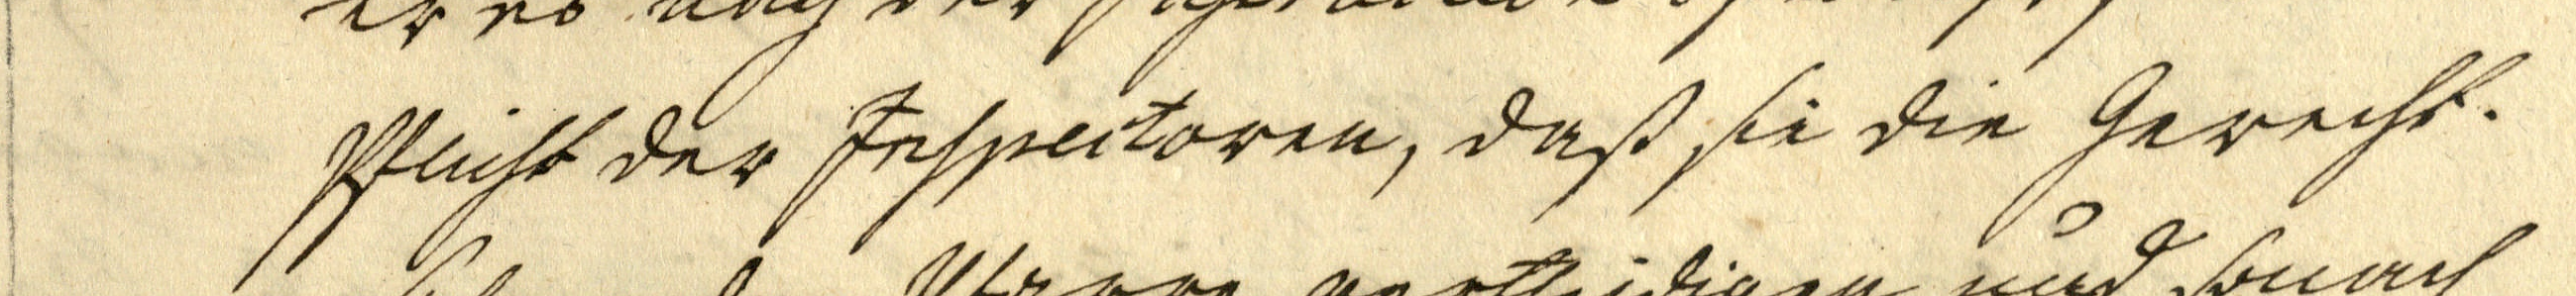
Pflicht der Inspectoren, daß sie die Gerecht-
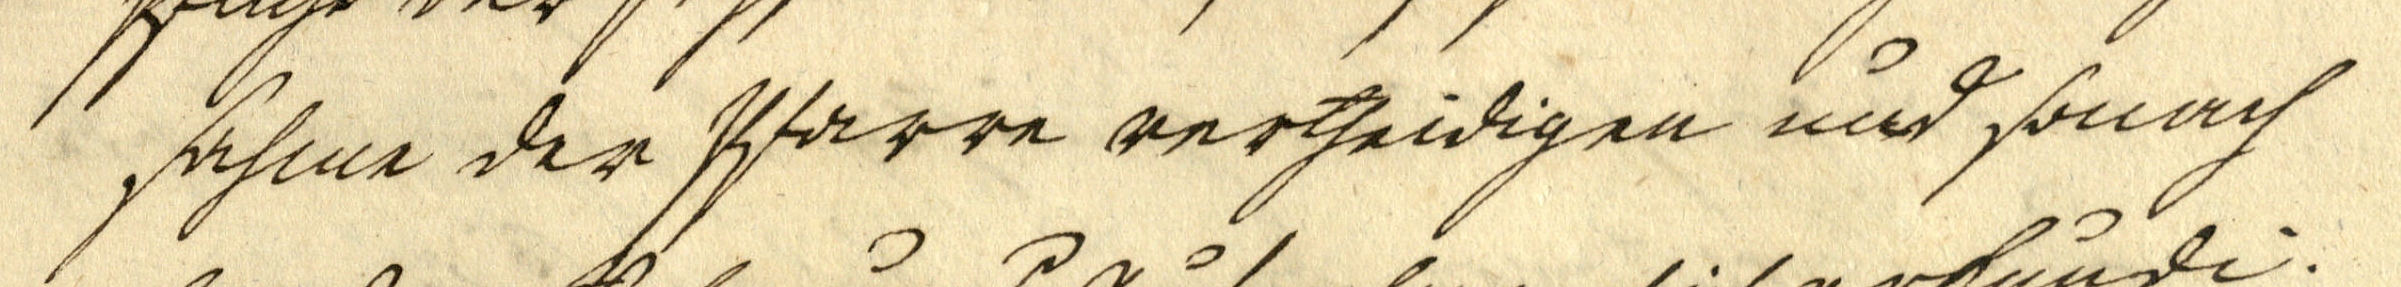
sahme der Pfarre vertheidigen und sonach
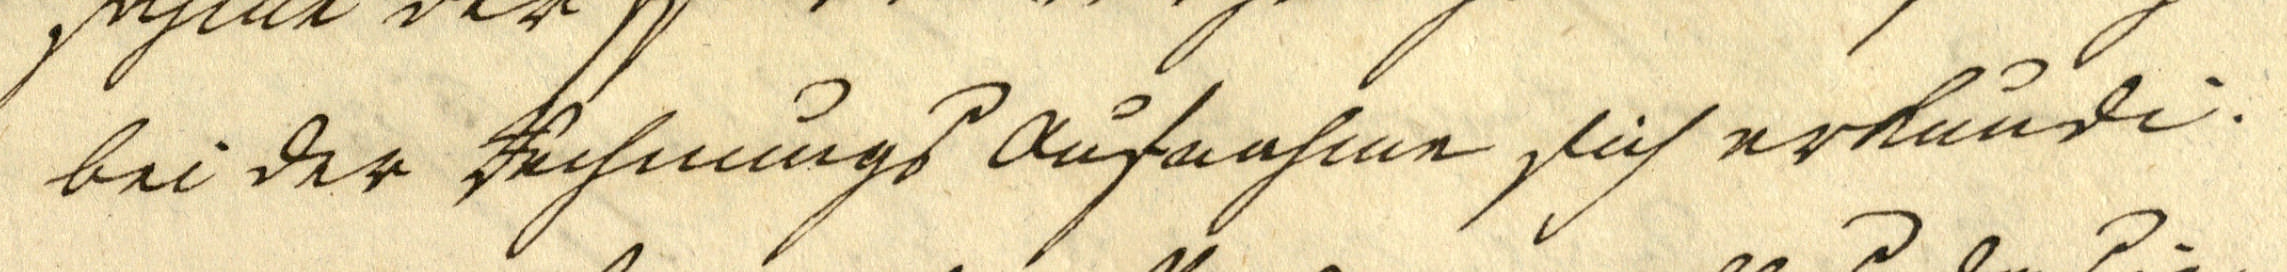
bei der Rechnungs Aufnahme sich erkundi-
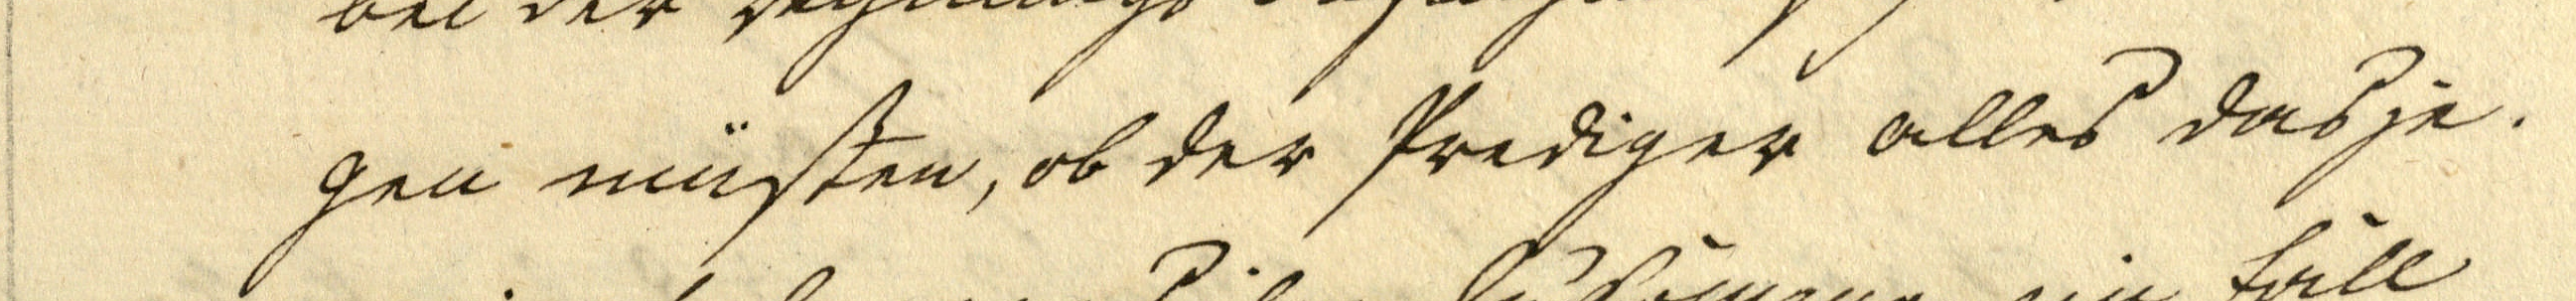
gen müßten, ob der Prediger alles dasje-
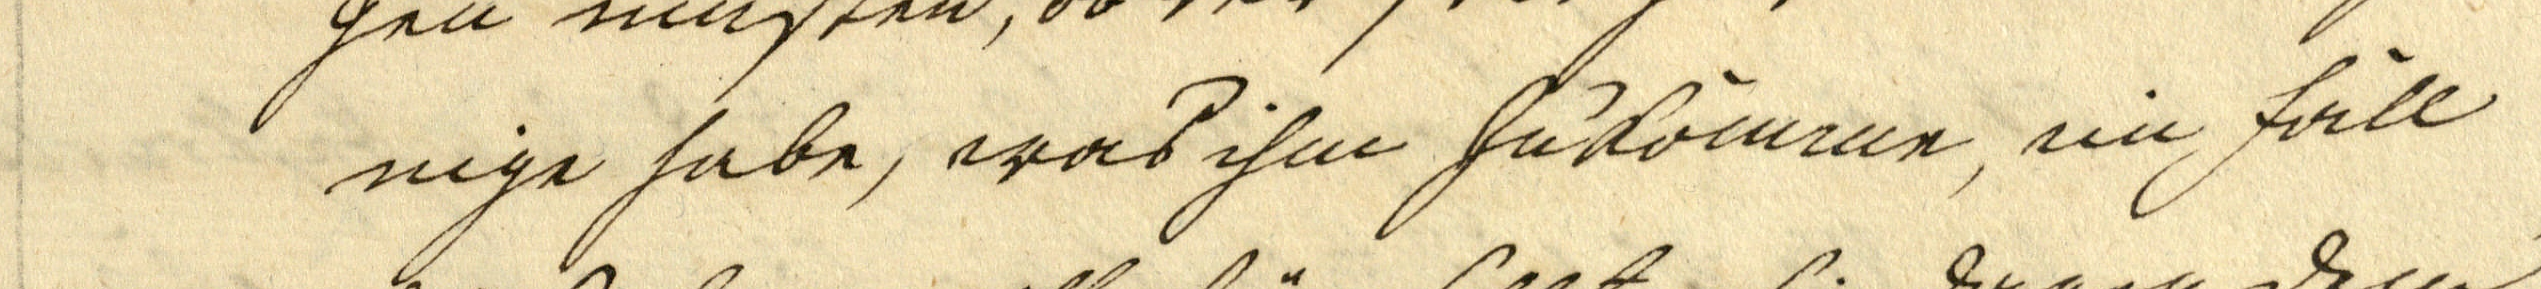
nige habe, was ihm zukomme, im Fall
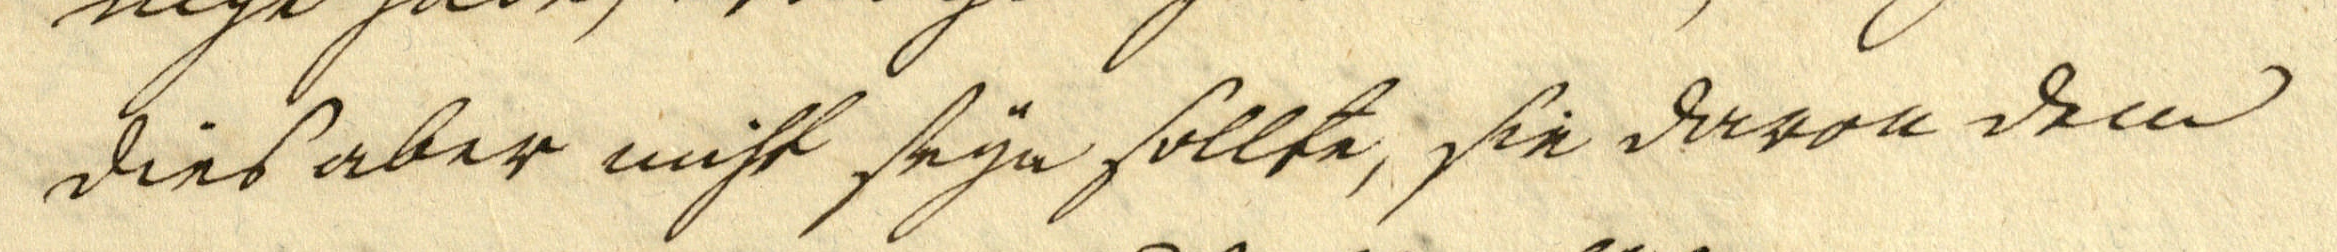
dies aber nicht seyn sollte, sie davon dem
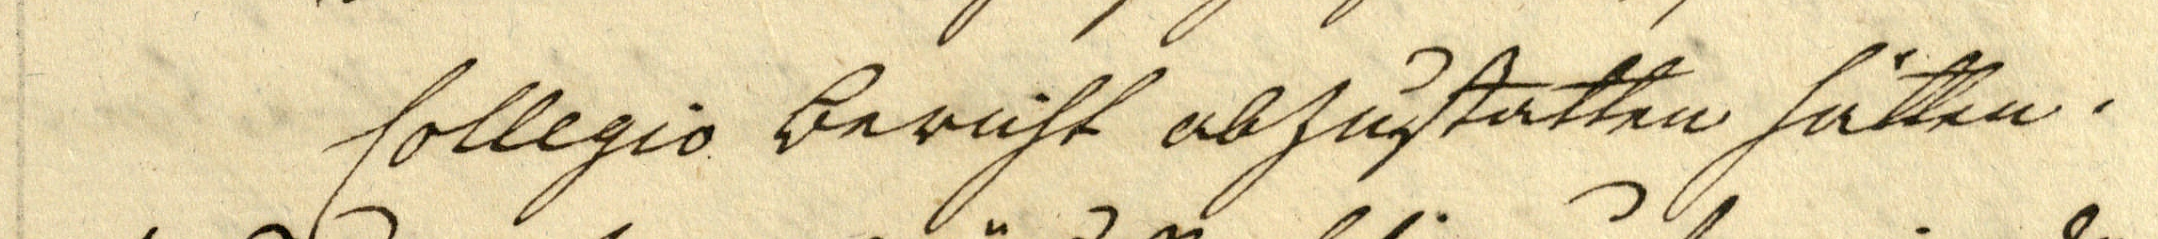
Collegio Bericht abzustatten hätten.
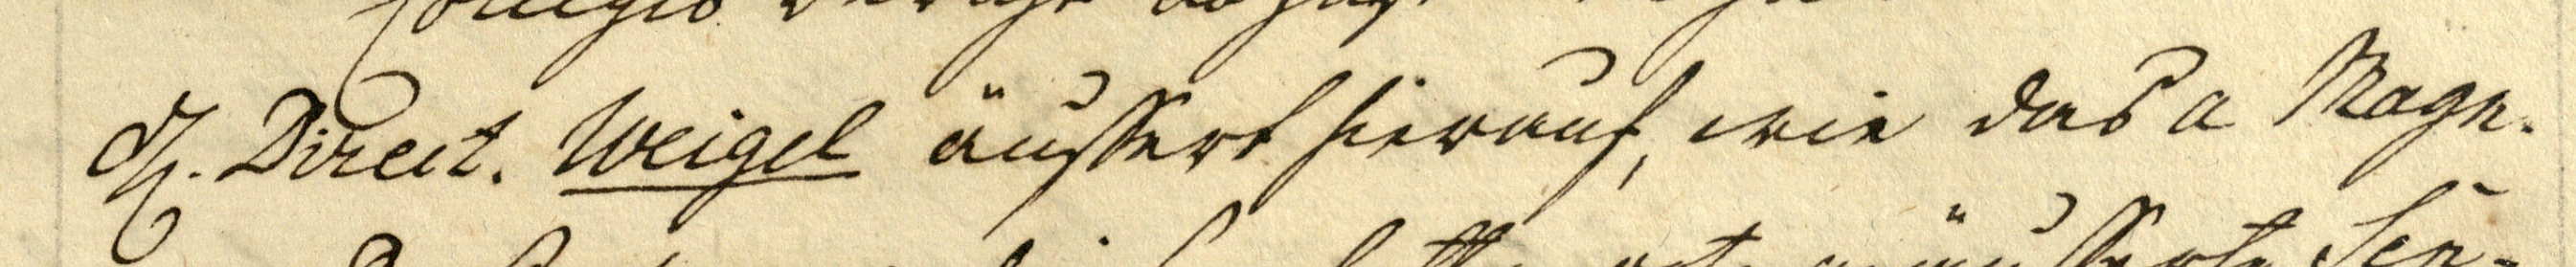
dh. Direct. Weigel äussert hierauf, wie das a Magn.
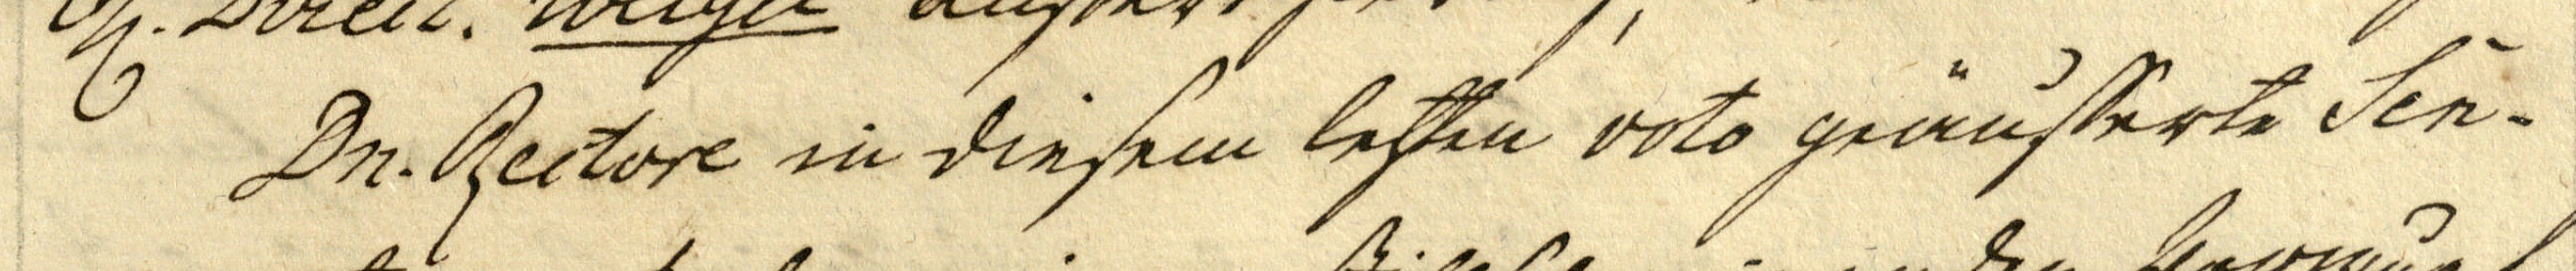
Dn. Rectore in diesem letzten voto geäusserte Sen-
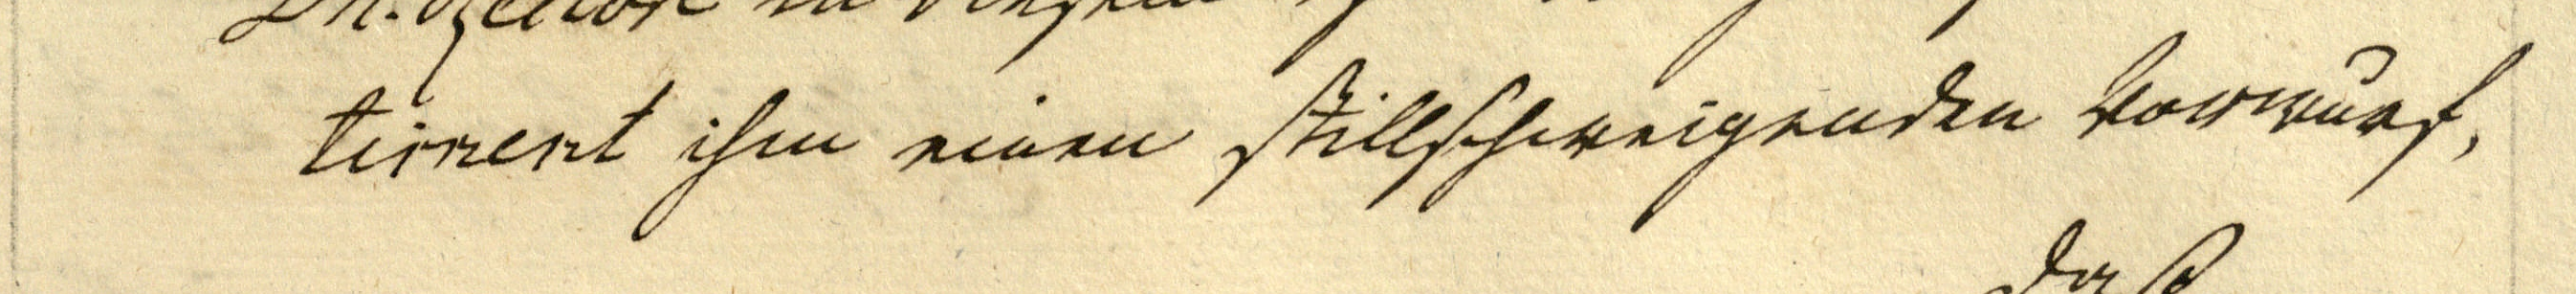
timent ihm einen stillschweigenden Vorwurf,
